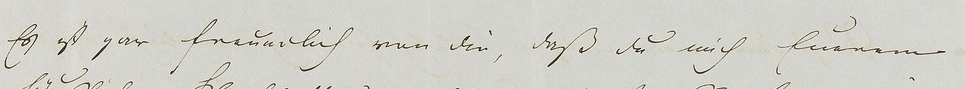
Es ist gar freundlich von dir, daß du mich Euerem
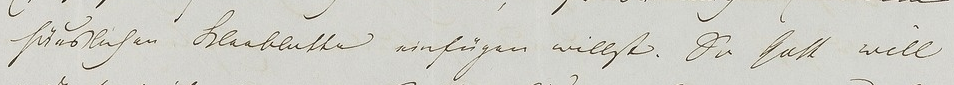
häuslichen Kleeblatte einfügen willst. So Gott will
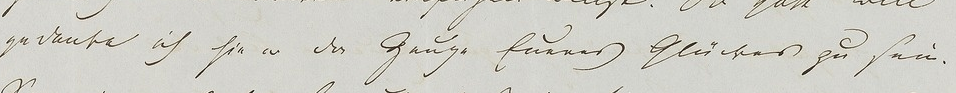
gedenke ich hie & da Zeuge Eueres Glückes zu sein.
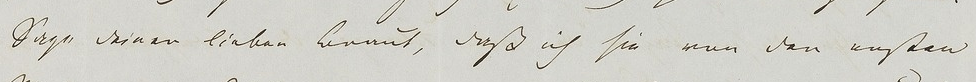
Sage deiner lieben Braut, daß ich sie von der ersten
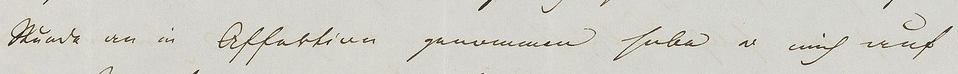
Stunde an in Affektion genommen habe & mich auf
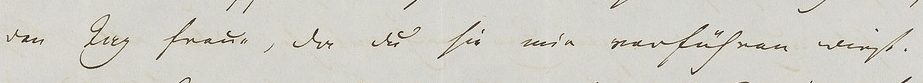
den Tag freue, da du sie mir vorführen wirst.
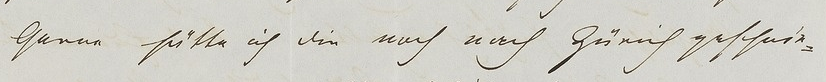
Gerne hätte ich dir noch nach Zürich geschrie-
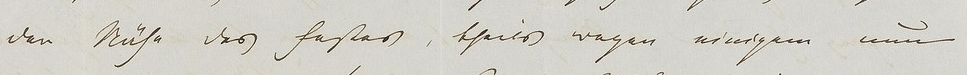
der Nähe des Festes, theils wegen einigem nun
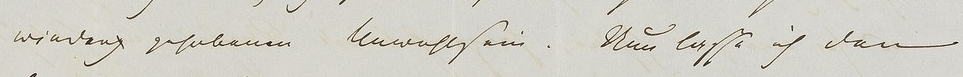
wieder gehobenen Unwohlsein. Nun lasse ich den
